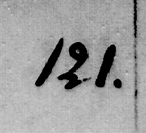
22.
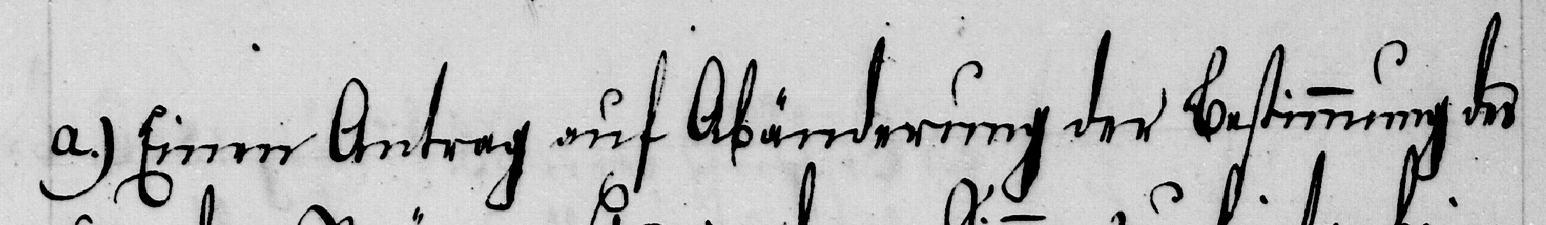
a.) Einen Antrag auf Abänderung der Bestimmung des
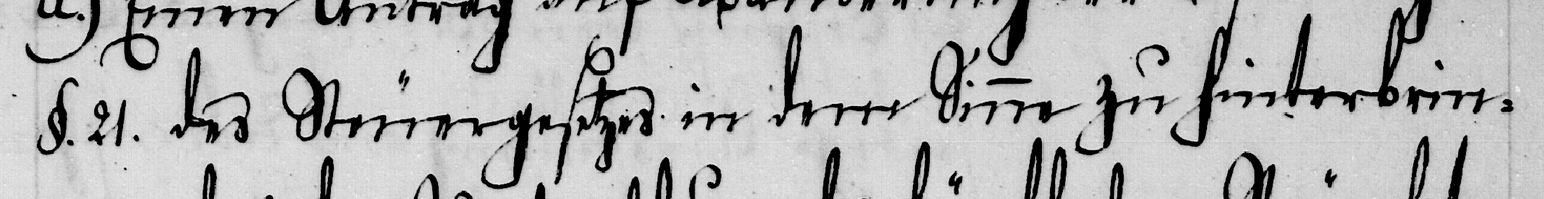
§. 21. des Steuergesetzes in dem Sinne zu hinterbrin¬
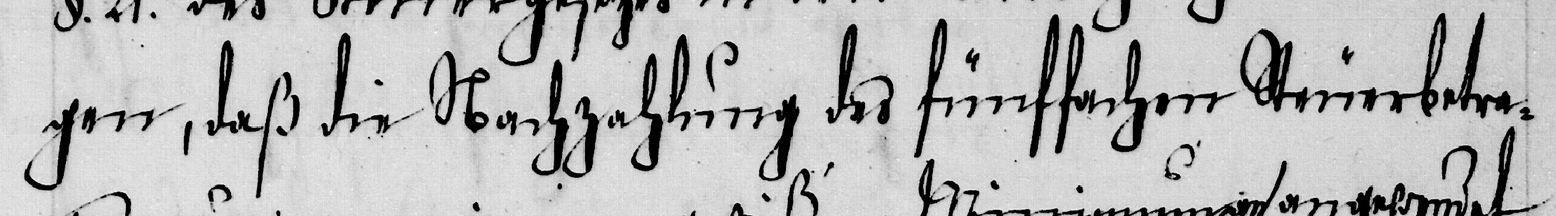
gen, daß die Nachzahlung des fünffachen Steuerbetra¬
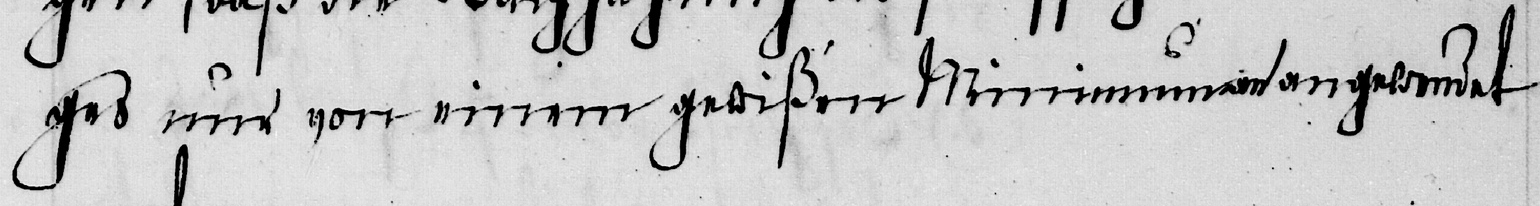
ges nur von einem gewißen Minimum an angewendet
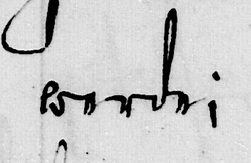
werde;
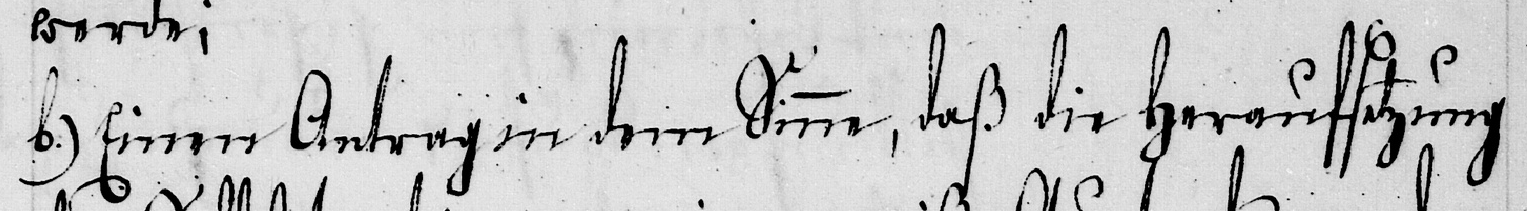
b.) Einen Antrag in dem Sinne, daß die Heraufsetzung
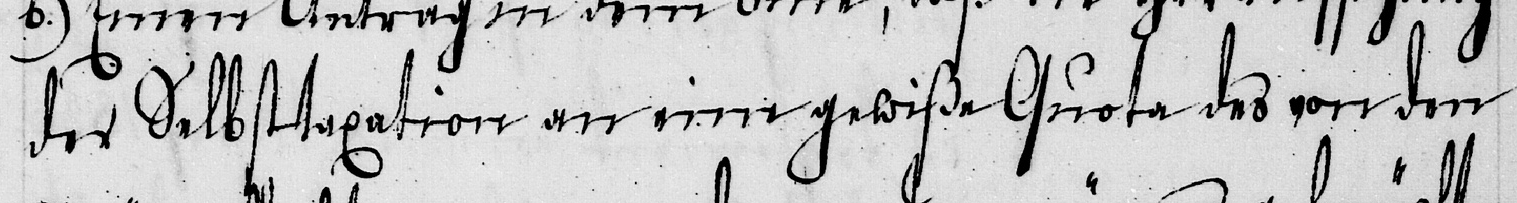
der Selbsttaxation an eine gewiße Quote des von den
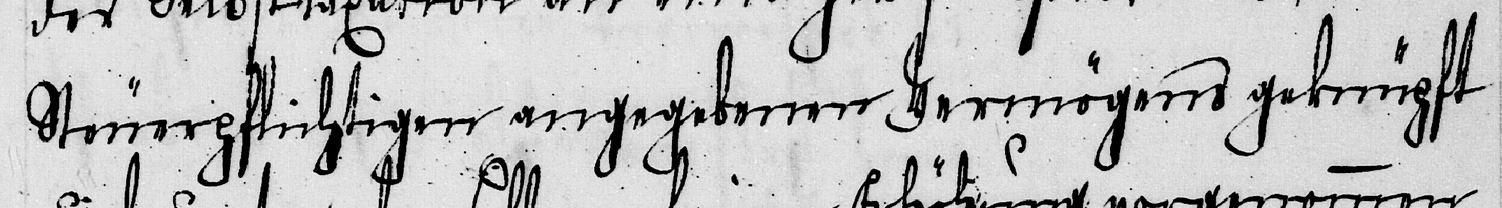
Steuerpflichtigen angegebenen Vermögens geknüpft
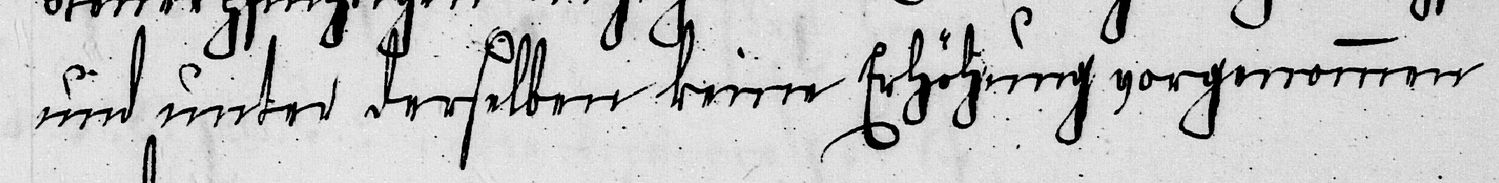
und unter derselben keine Erhöhung vorgenommen
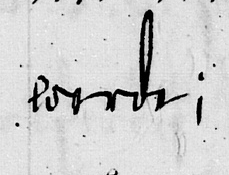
werde;
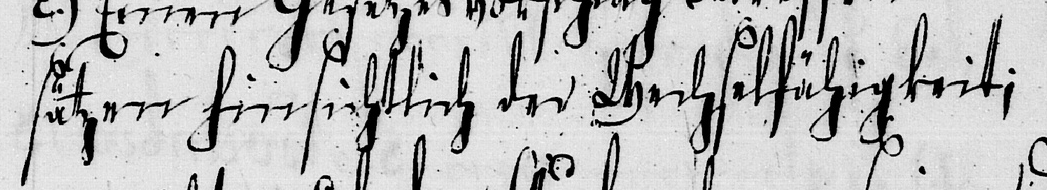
sätzen hinsichtlich der Wechselfähigkeit;
